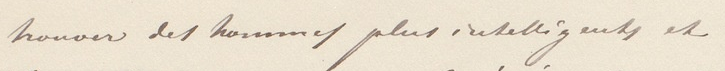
trouver des hommes plus intelligents et
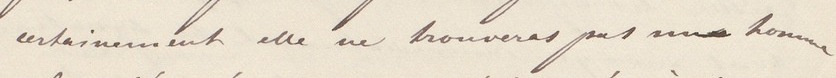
certainement elle ne tourveras pas une homme
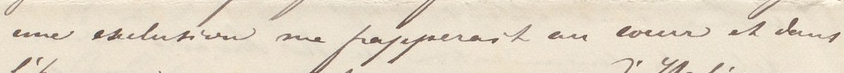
une exclusion me frapperait au cour et dans
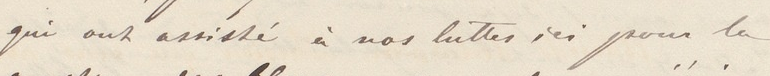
qui on assisté à nos luttes ici pour la
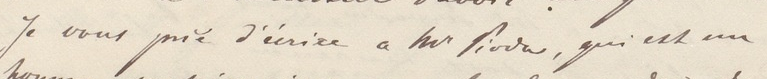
Je vous prie d'écrie a MrPioda, qui est un
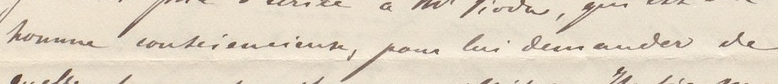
homme consciencieux, pour lui demander de
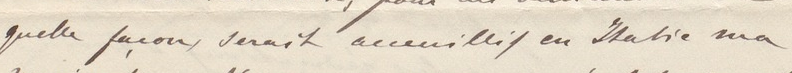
quelle façon serait acceuillis en Italie ma
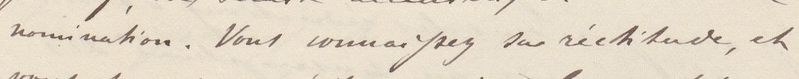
nomination. Vous connaissez sa réctitude, et
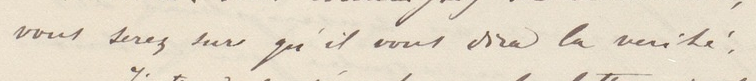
vous serez sur qu'il vous dira la verité.
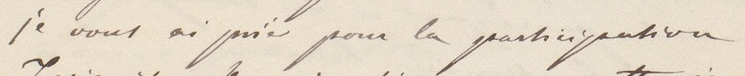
je vous ai prié pour la participation
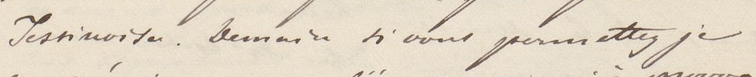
Tessinoise. Demain si vous permettez je
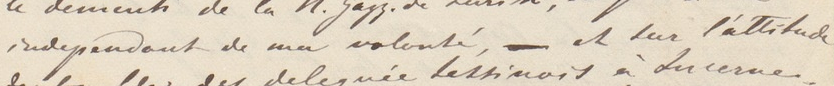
independant de ma volonté, – et sur l'attitude
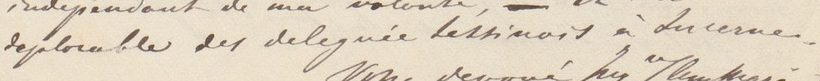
deplorable des deleguée tessinois à Lucerne.
